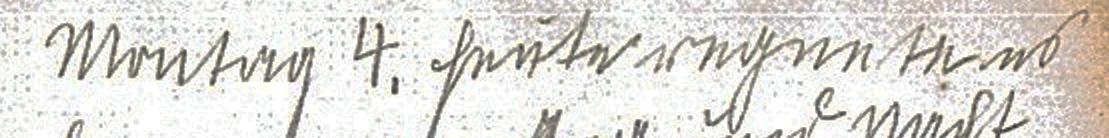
Montag 4. heute regnete es
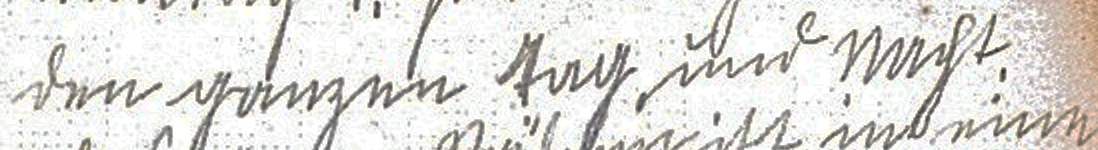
den ganzen Tag und Nacht.
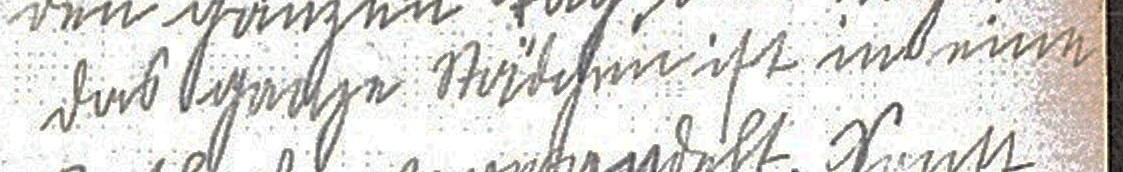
Das ganze Stxihim ist in eine
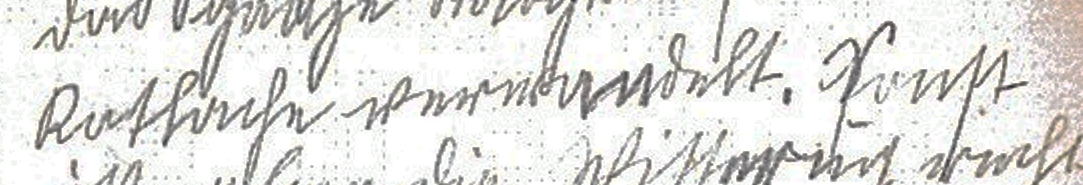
Kotlache verwandelt. Sonst
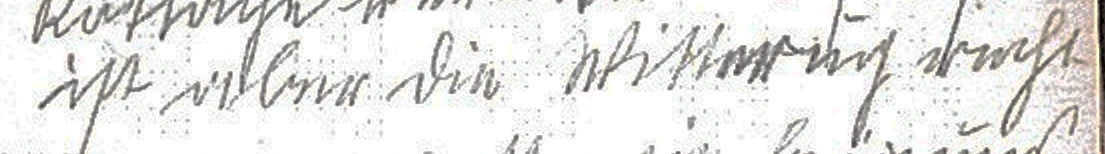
ist aber die Witterung recht
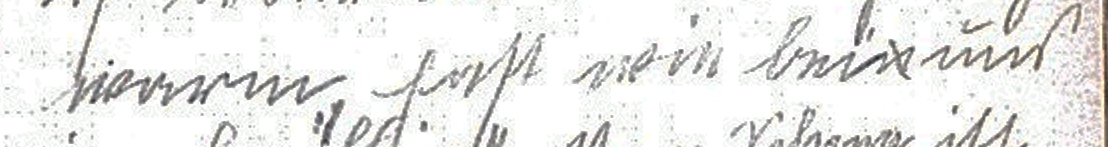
warm fast wie bei uns
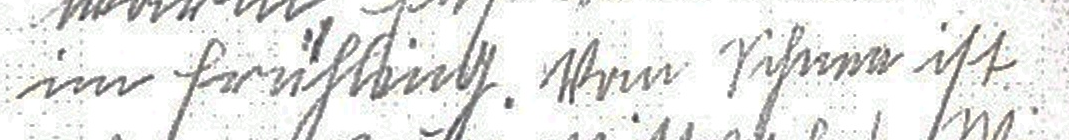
im Frühling. Von Schnee ist
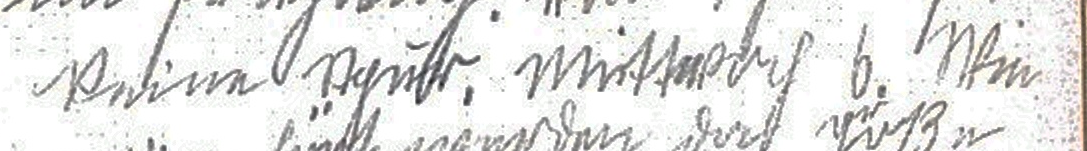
keine Spur. Mittwoch 6. Wie
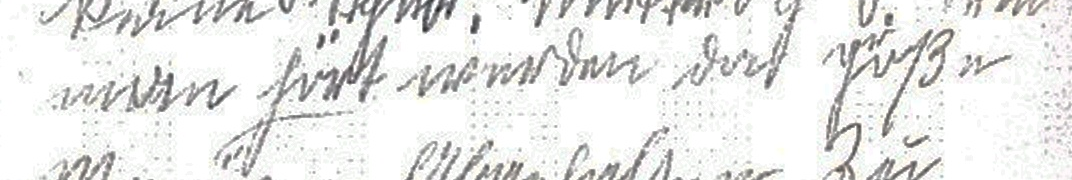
man hört werden dort große
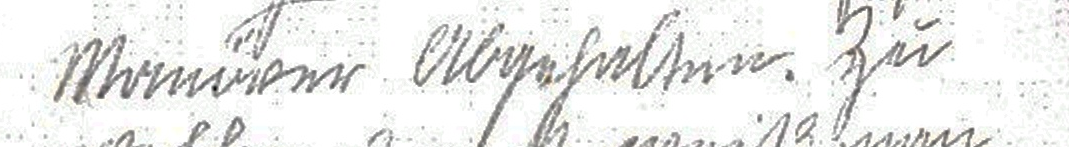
Manöver abgehalten. Zu
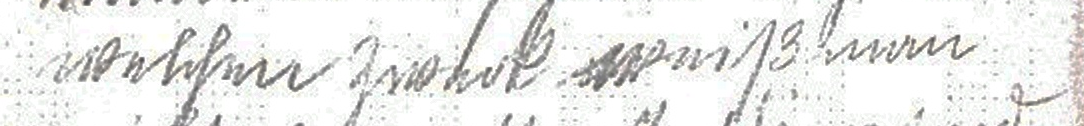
welchem Zweck weiß man
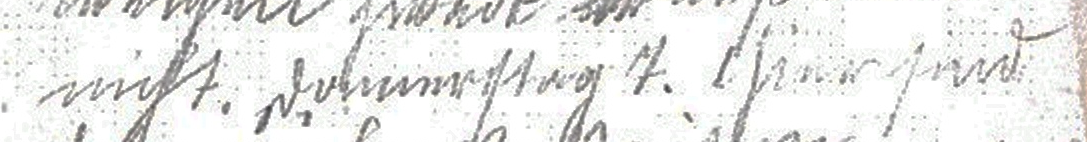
nicht. Donnerstag 7. Hier sind
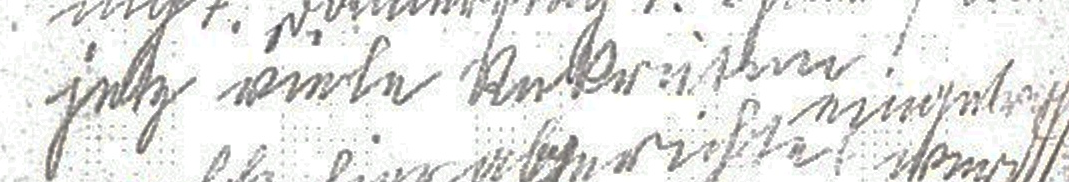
jetzt viele Reservisten.
